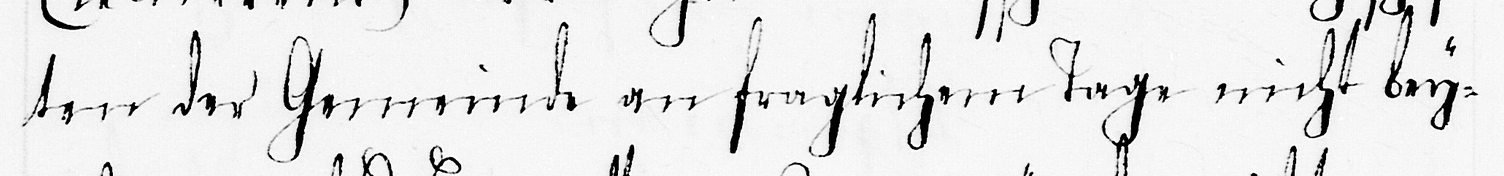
ften der Gemeinde an fraglichem Tage nicht bey¬
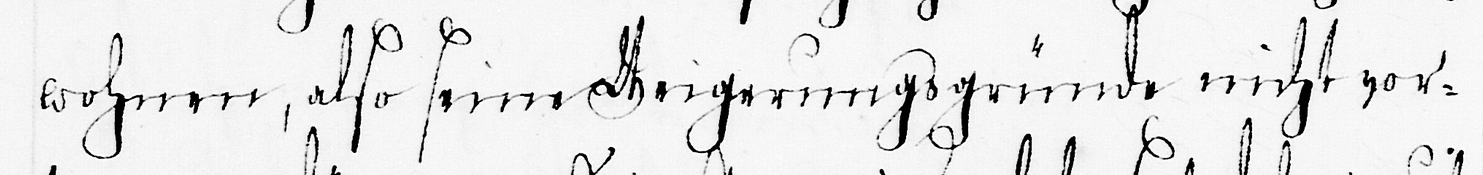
wohnen, also seine Weigerungsgründe nicht vor¬
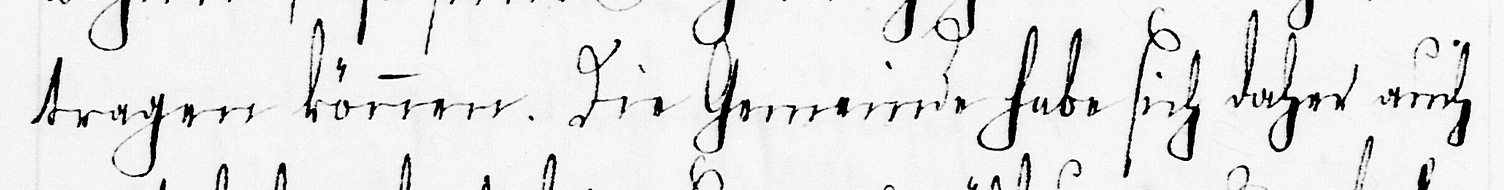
tragen könne. Die Gemeinde habe sich daher auch
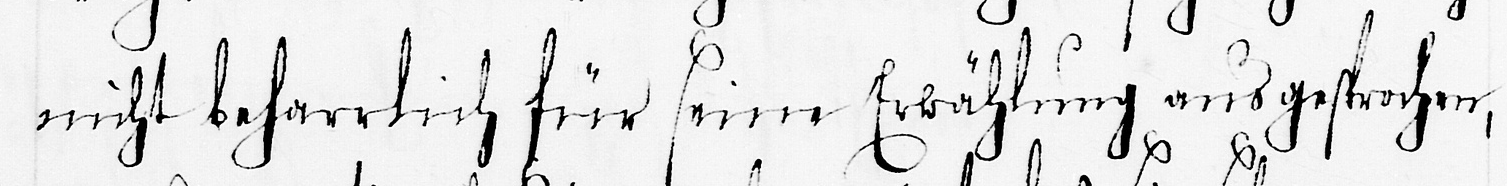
nicht beharrlich für seine Erwählung ausgesproche¬
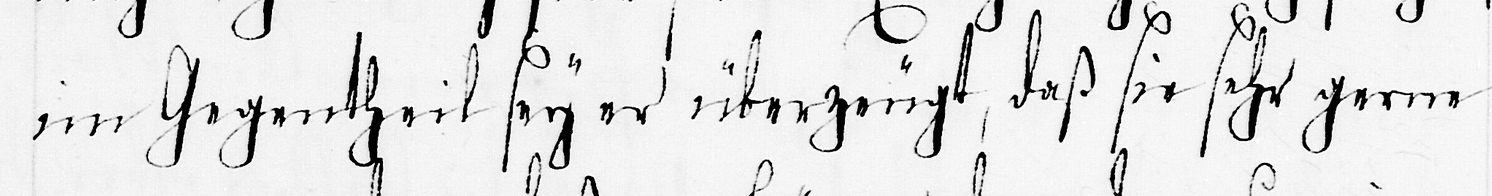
im Gegentheil sey er überzeugt, daß sie sehr gerne
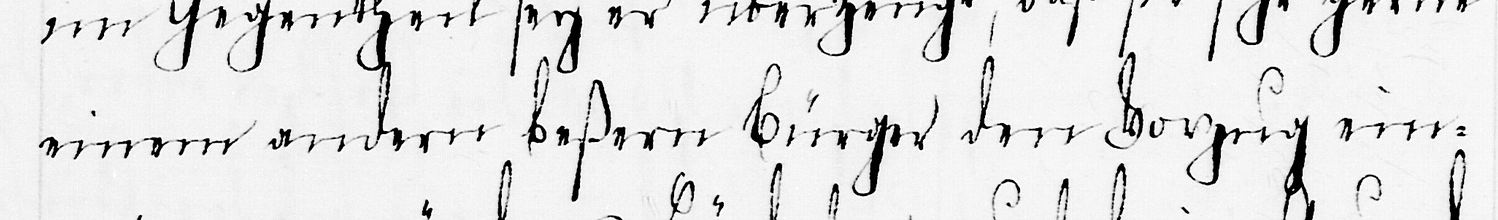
einem andern beßern Bürger den Vorzug ein¬
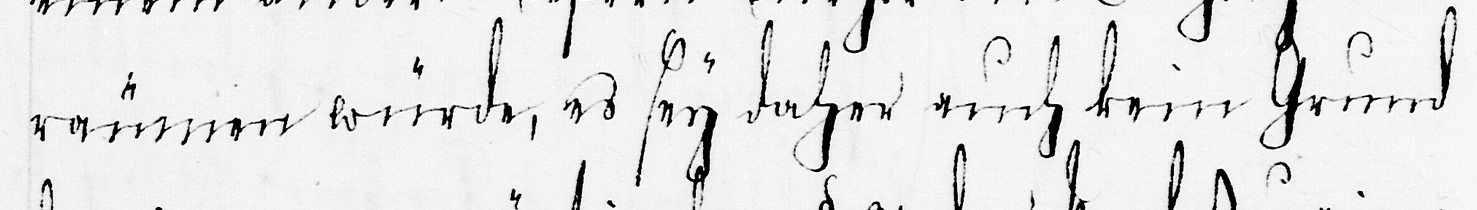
räumen würde, es sey daher auch kein Grund
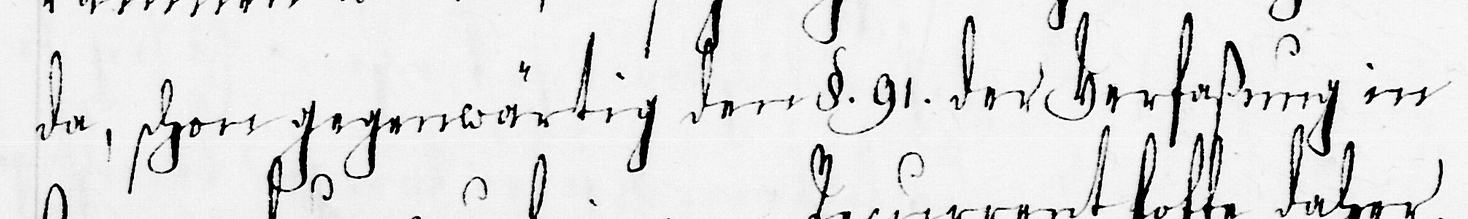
da, schon gegenwärtig den §. 91. der Verfaßung in
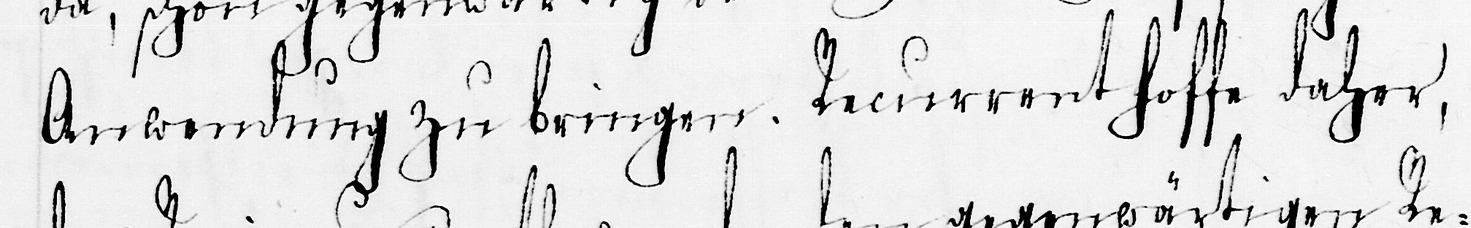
Anwendung zu bringen. Recurrent hoffe daher,
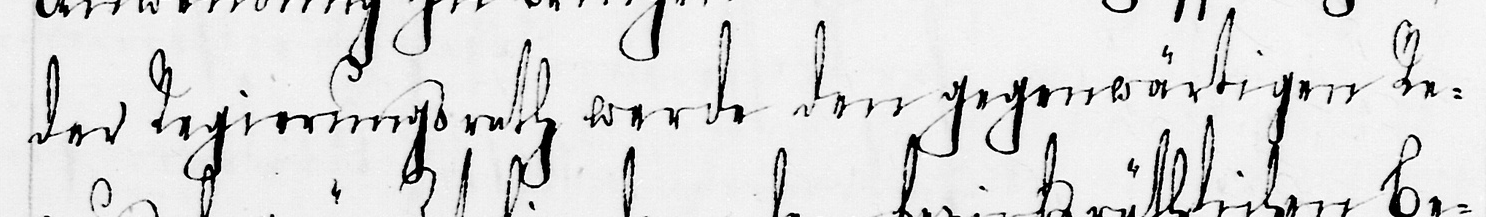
der Regierungsrath werde den gegenwärtigen Re¬
